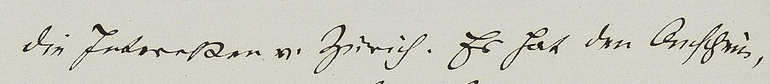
die Intereßen v. Zürich. Es hat den Anschein,
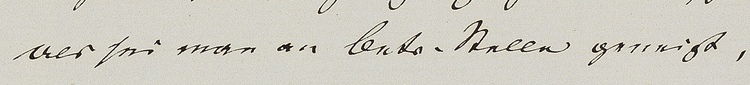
als sei man an betr. Stelle geneigt,
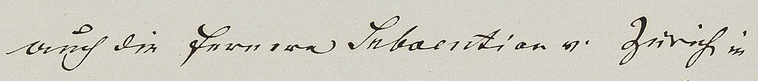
auch die fernere Subvention v. Zürich in
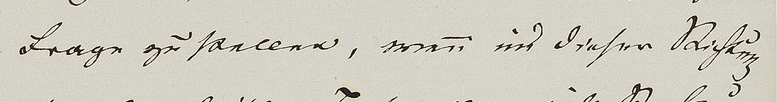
Frage zu stellen, wenn in dieser Richtung
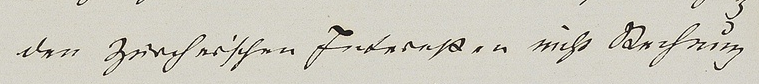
den Zürcherischen Intereßen nicht Rechnung
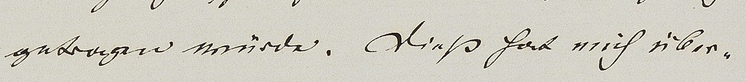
getragen würde. Dieß hat mich über-
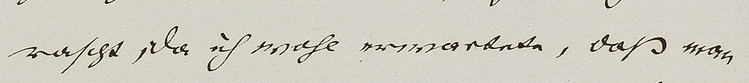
rascht, da ich wohl erwartete, daß man
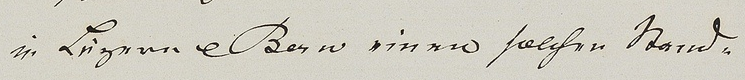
in Luzern & Bern einen solchen Stand-
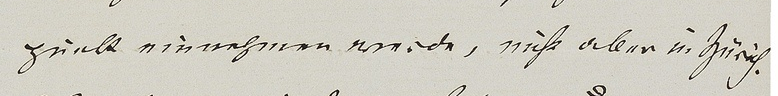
punkt einnehmen werde, nicht aber in Zürich.
